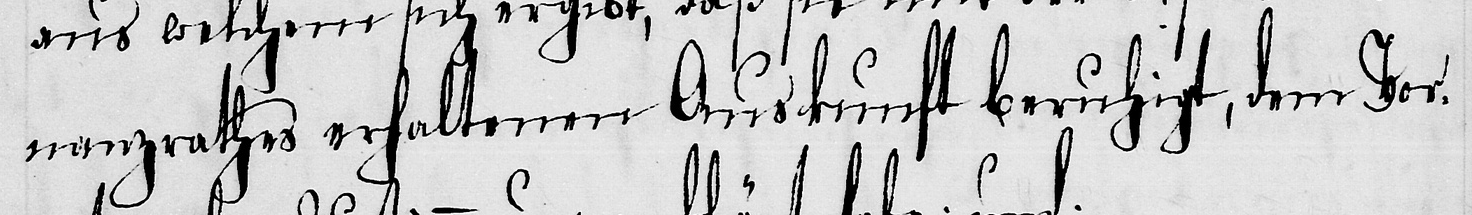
nanzrathes erhaltenen Auskunft beruhigt, dem Vor¬
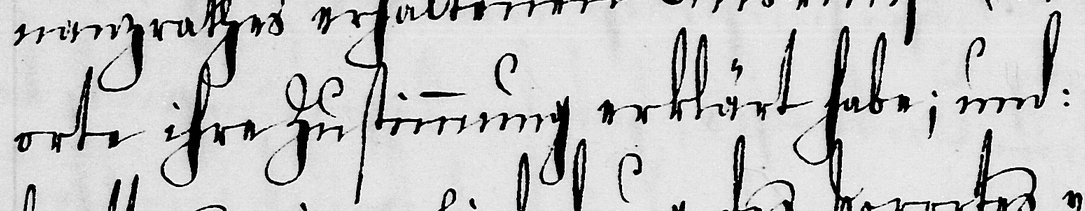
orte ihre Zustimmung erklärt habe; und:
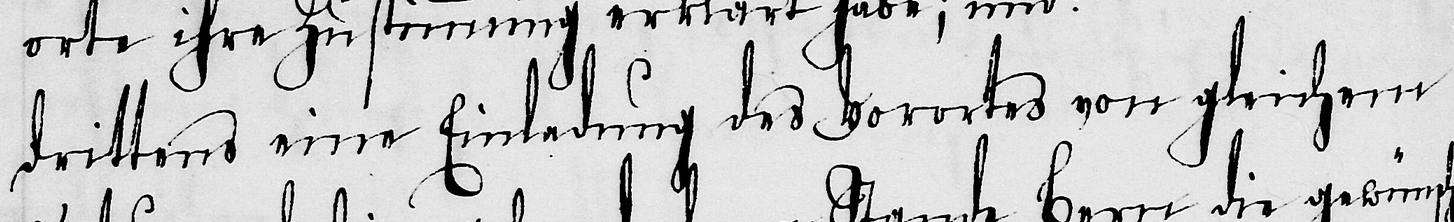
drittens eine Einladung des Vorortes von gleichem
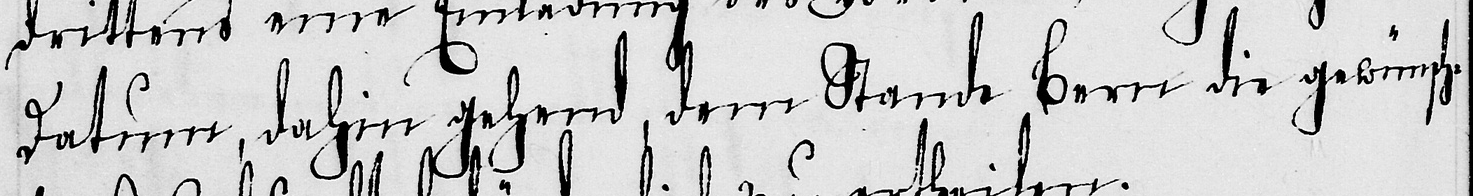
Datum, dahin gehend, dem Stande Bern die gewünsc¬
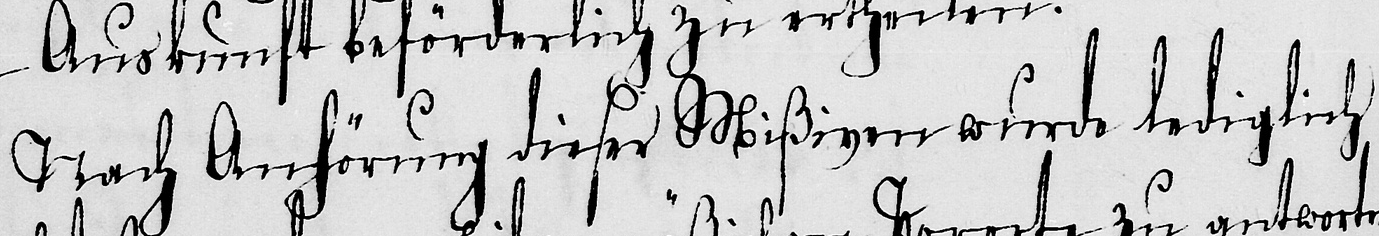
Nach Anhörung dieser Mißiven wurde lediglich
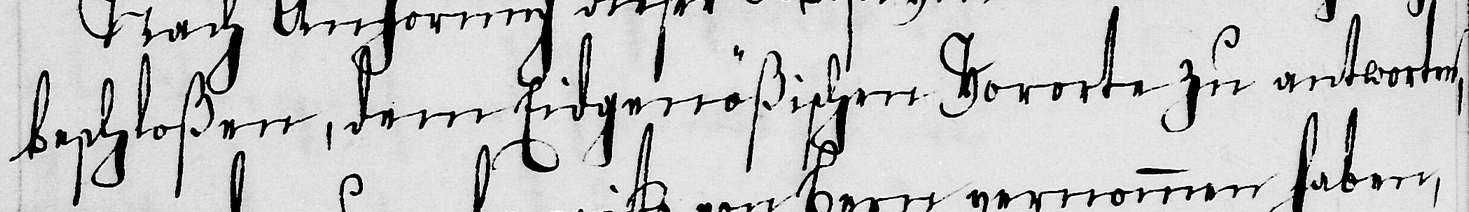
beschloßen, dem Eidgenößischen Vororte zu antwor¬
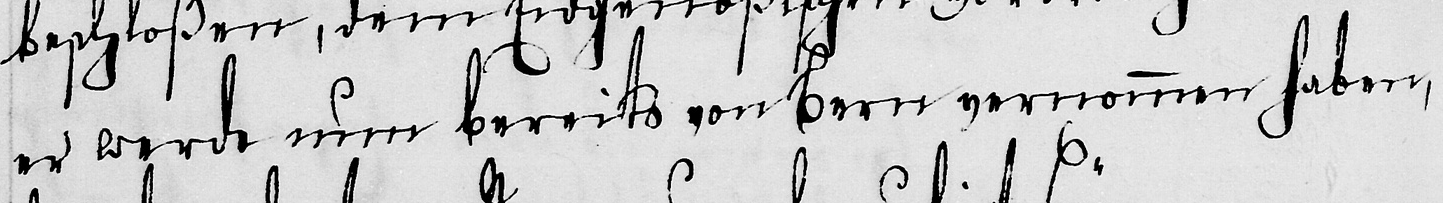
er werde nun bereits von Bern vernommen haben,
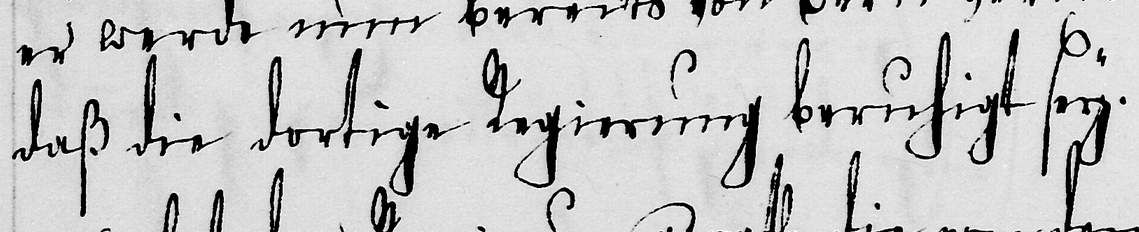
daß die dortige Regierung berhuhigt sey.
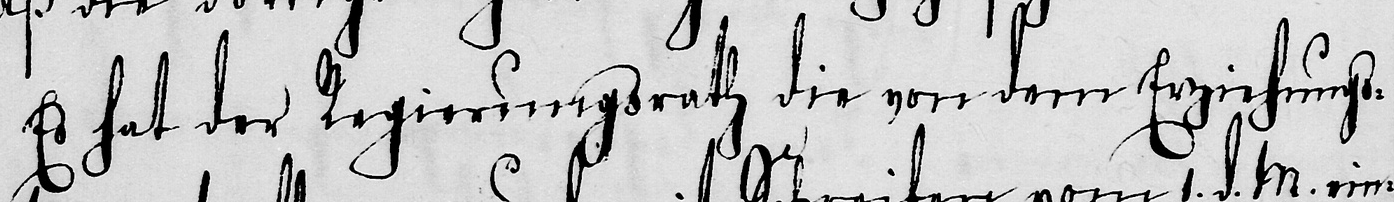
Es hat der Regierungsrath die von dem Erziehungs¬
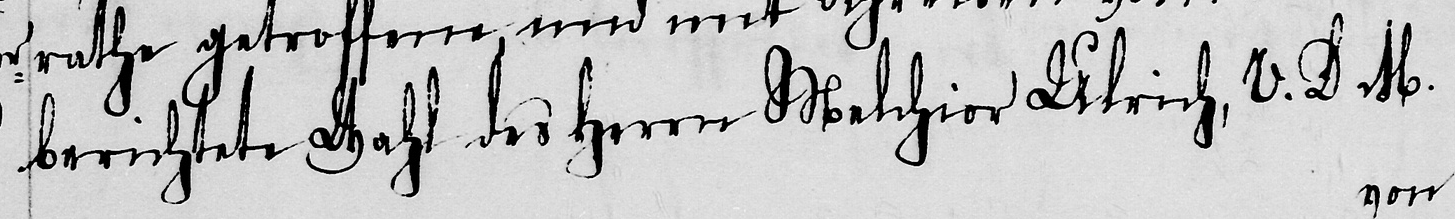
berichtete Wahl des Herrn Melchior Ulrich, V. D. M.
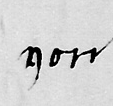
vom
